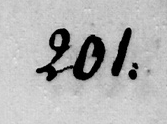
80.
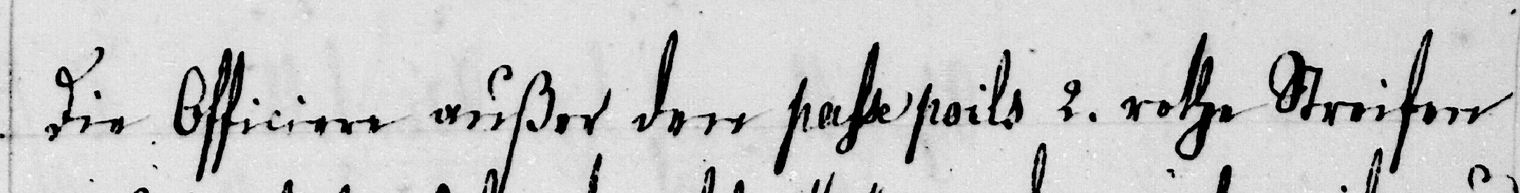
Die Officiere außer den passer poils 2. rothe Streifen
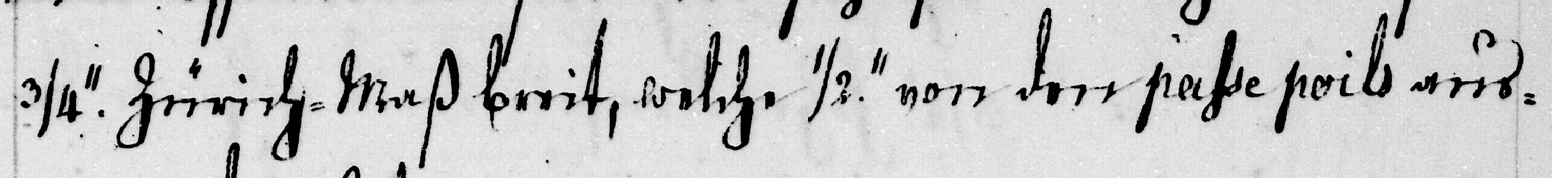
¾“. Zürich-Maß breit, welche ½“. von den passe poils aus¬
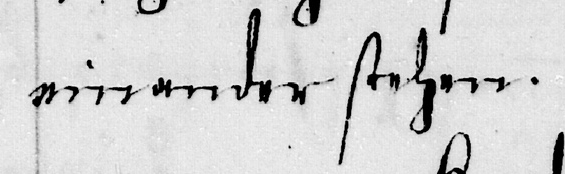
einander stehen.
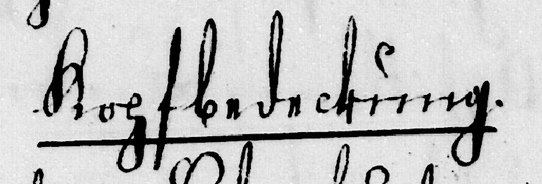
Kopfbedeckung.
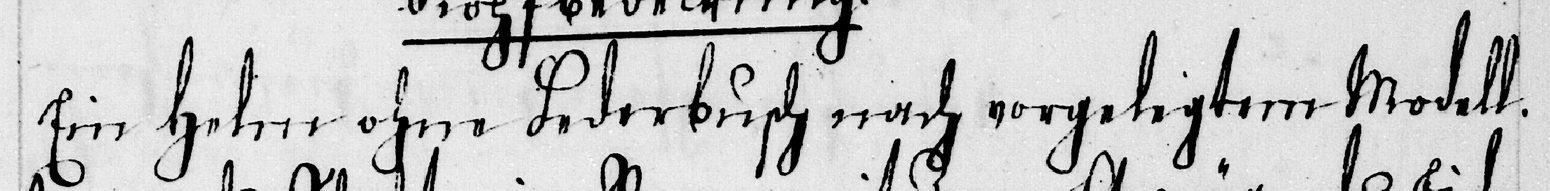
Ein Helm ohne Federbusch nach vorgelegtem Modell.
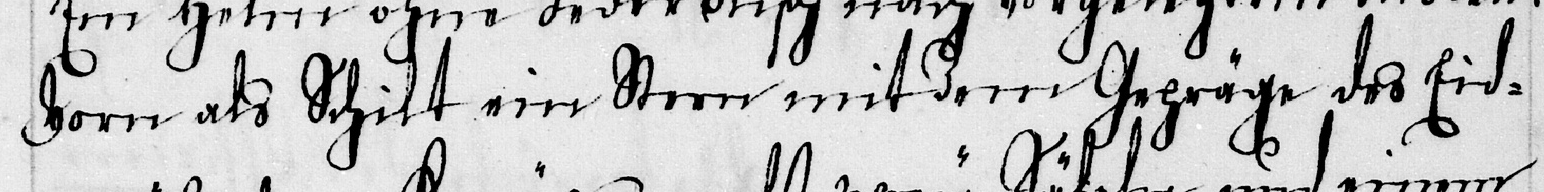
Vorn als Schilt ein Stern mit dem Gepräge des Eid¬
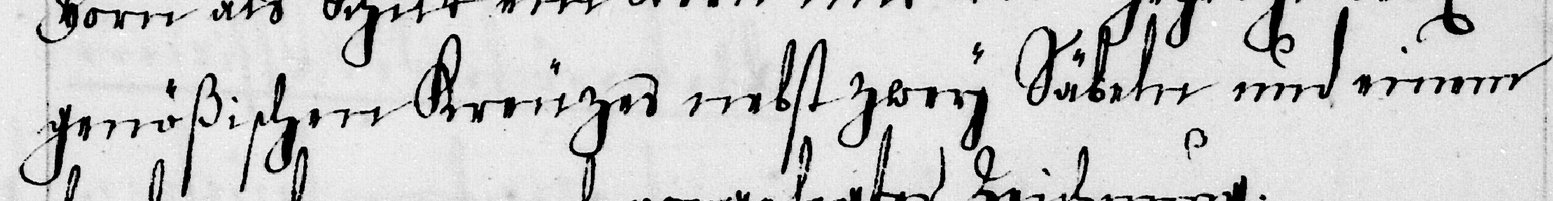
genößischen Kreuzes nebst zwey Säbeln und einem
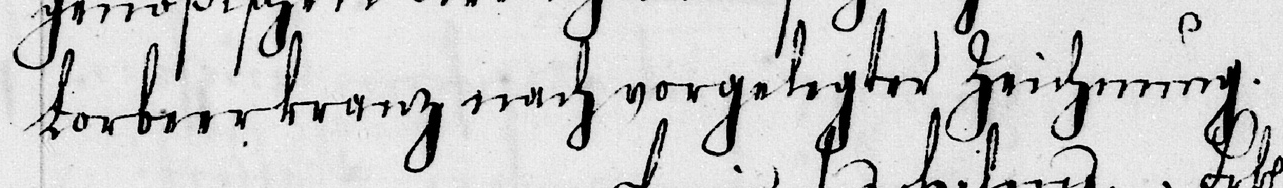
Lorbeerkranz nach vorgelegter Zeichnung.
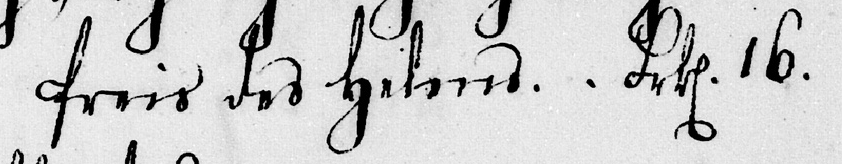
Preis des Helms. Frk[en]. 16.
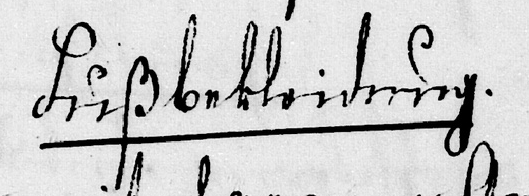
Fußbekleidung.
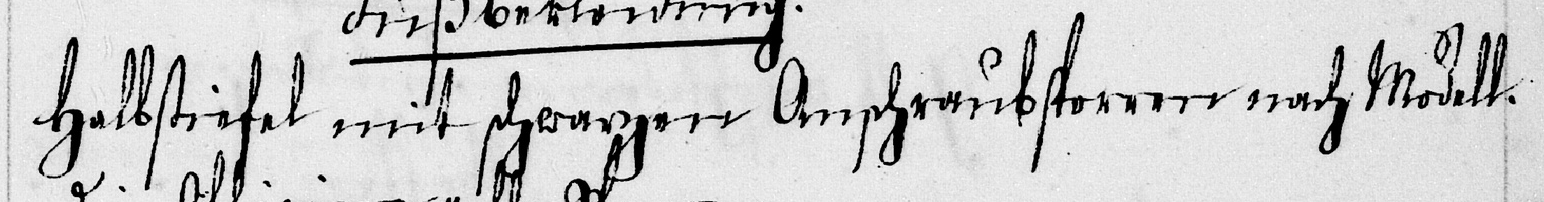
Halbstiefel mit schwarzen Anschraubsporren nach Modell.
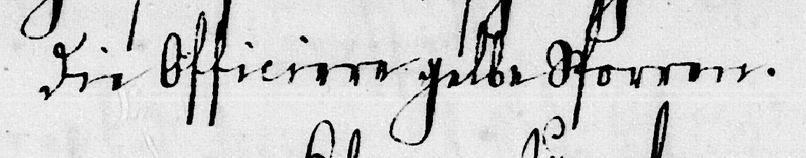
Die Officiere gelbe Sporren.
